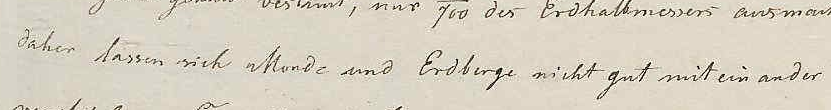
daher lassen sich Monde- und Erdberge nicht gut miteinander
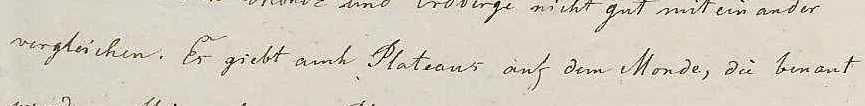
vergleichen. Es giebt auch Plateaus auf dem Monde, die benant
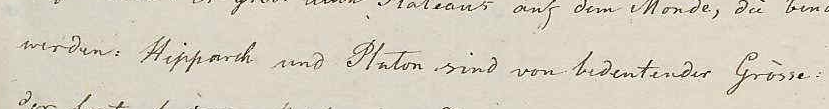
werden: Hipparch und Platon sind von bedeutender Grösse:
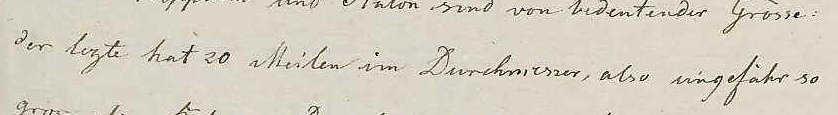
der lezte hat 20 Meilen im Durchmesser, also ungefähr so
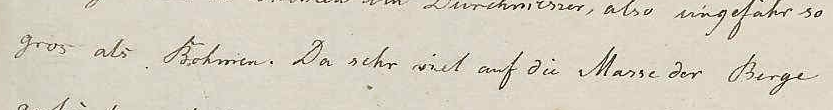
gros als Böhmen. Da sehr viel auf die Masse der Berge
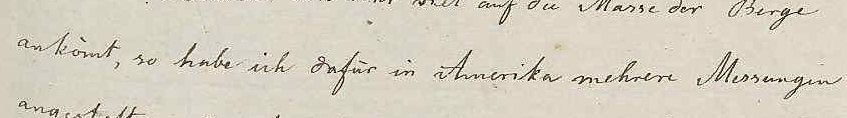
ankömt, so habe ich dafür in Amerika mehrere Messungen
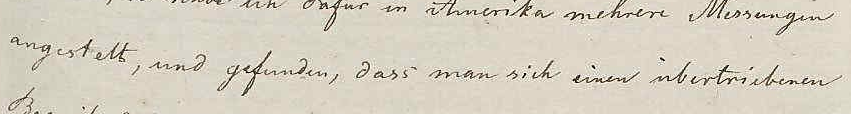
angestelt, und gefunden, dass man sich einen übertriebenen
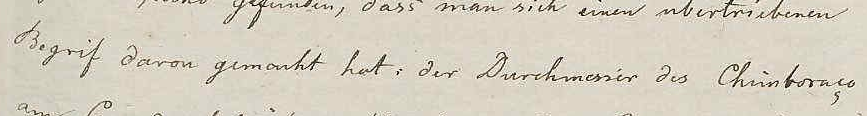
Begrif davon gemacht hat: der Durchmesser des Chimboraço
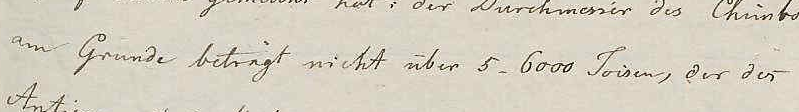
am Grunde beträgt nicht über 5–6000 Toisen, der des
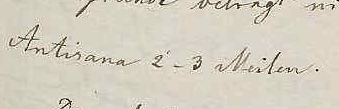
Antisana 2–3 Meilen.
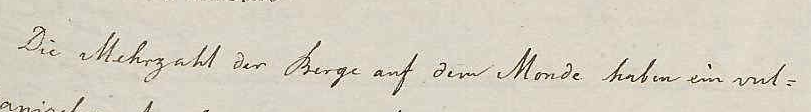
Die Mehrzahl der Berge auf dem Monde haben ein vul-
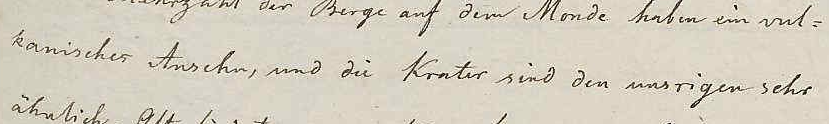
kanisches Ansehn, und die Krater sind den unsrigen sehr
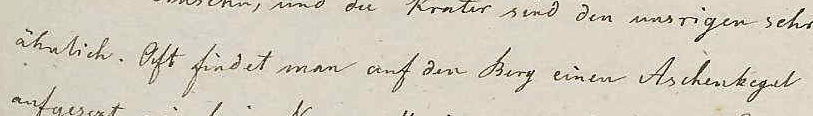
ähnlich. Oft findet man auf den Berg einen Aschenkegel
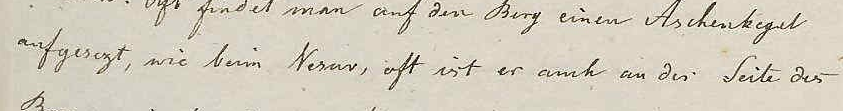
aufgesezt, wie beim Vesuv, oft ist er auch an der Seite des
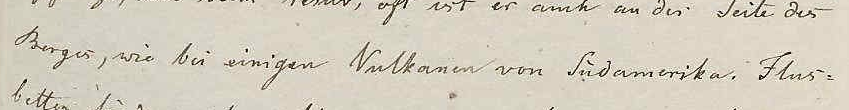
Berges, wie bei einigen Vulkanen von Südamerika. Flus-
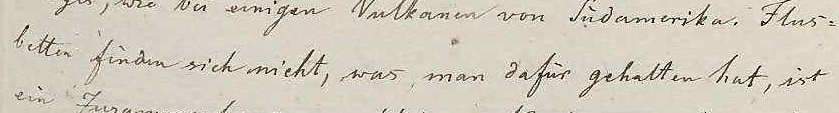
betten finden sich nicht, was man dafür gehalten hat, ist
